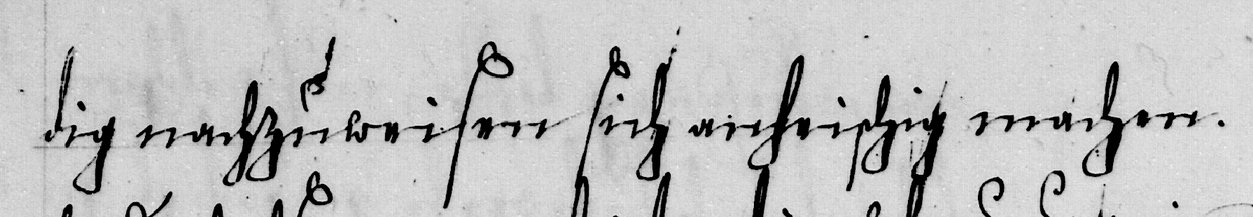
dig nachzuweisen sich anheischig machen.
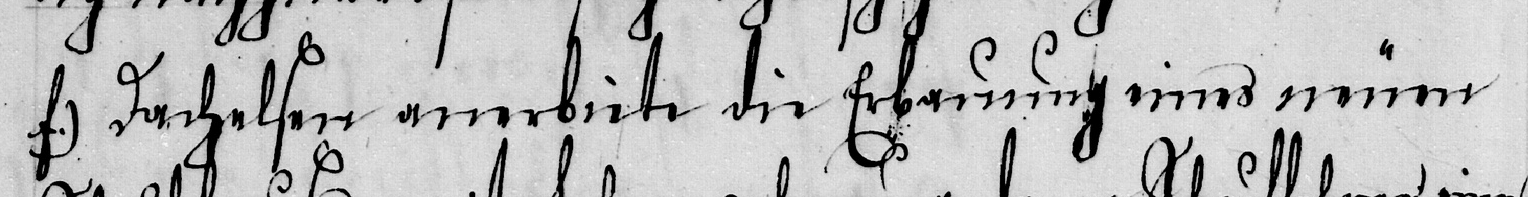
f.) Dachelsen anerbiete die Erbauung eines neuen
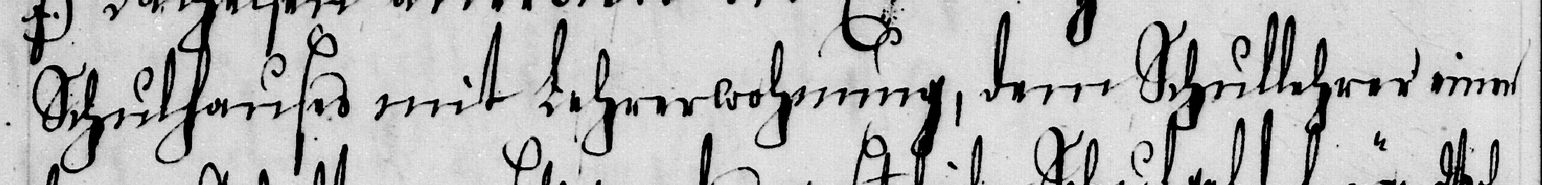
Schulhauses mit Lehrerwohnung, dem Schullehrer einen
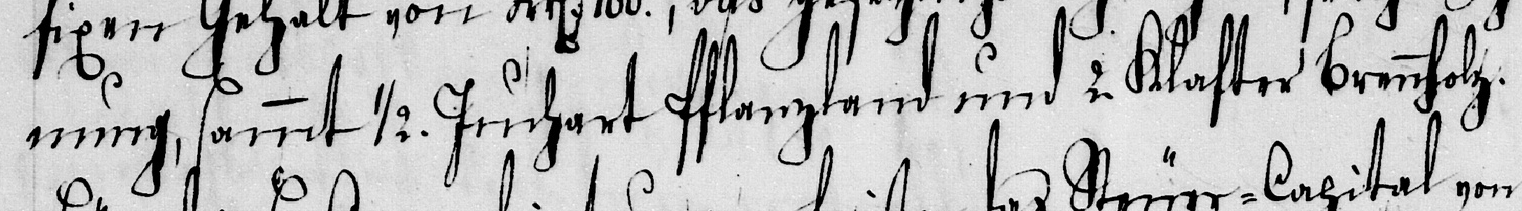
nung, sammt 1/2. Juchart Pflanzland und 2. Klafter Brennh¬
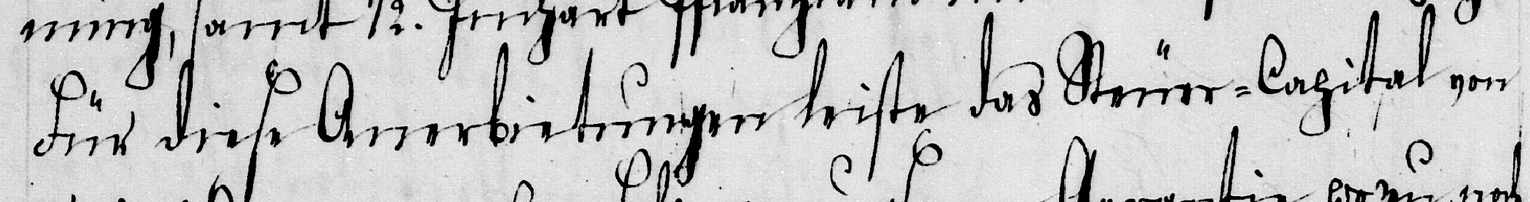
Für diese Anerbietung leiste das Steuer-Capital von
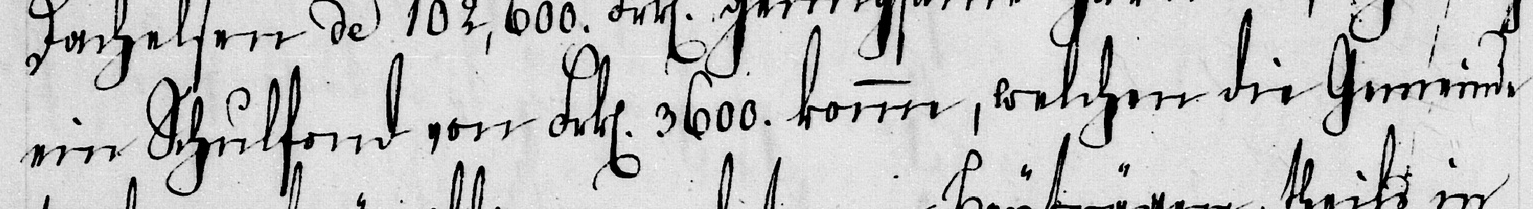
ein Schulfond von Frk[en]. 3600. komme, welchn die Gemeinde
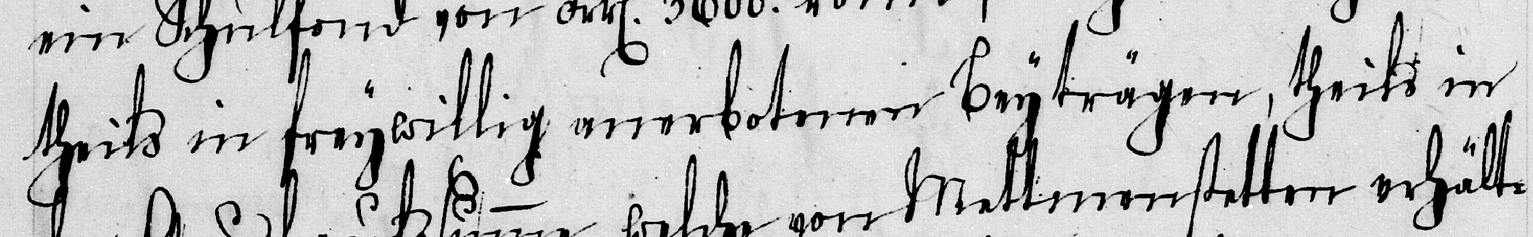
theils in freywillig anerbotenen Beyträgen, theils in
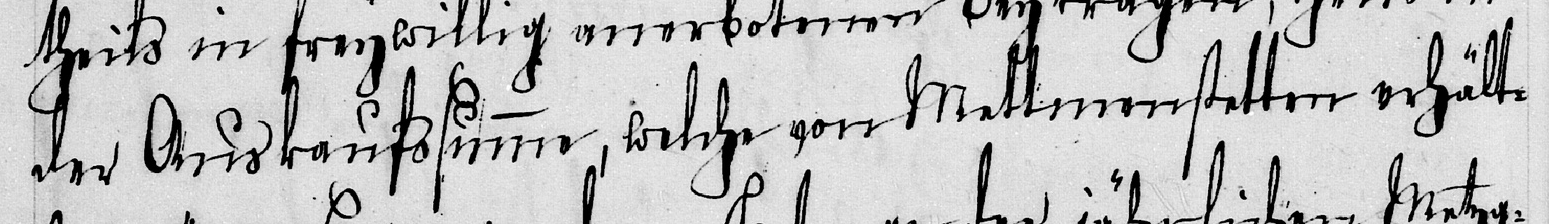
der Auskaufssumme, welche von Mettmenstetten erhält¬
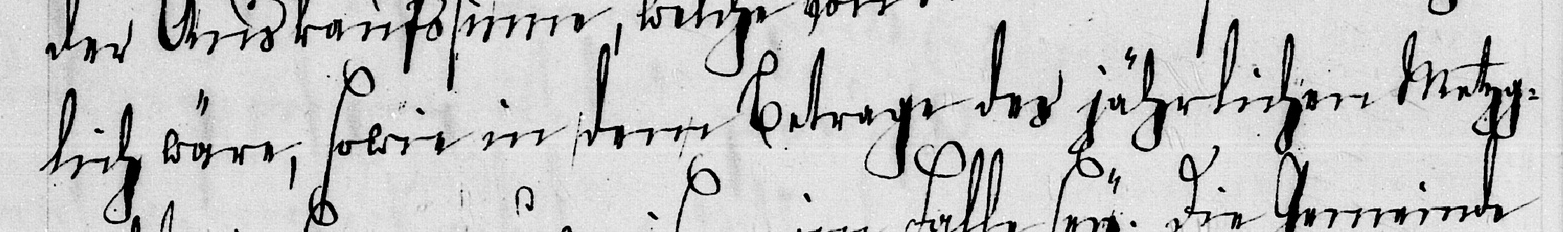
lich wäre, sowie in dem Betrage des jährlichen Metzg¬
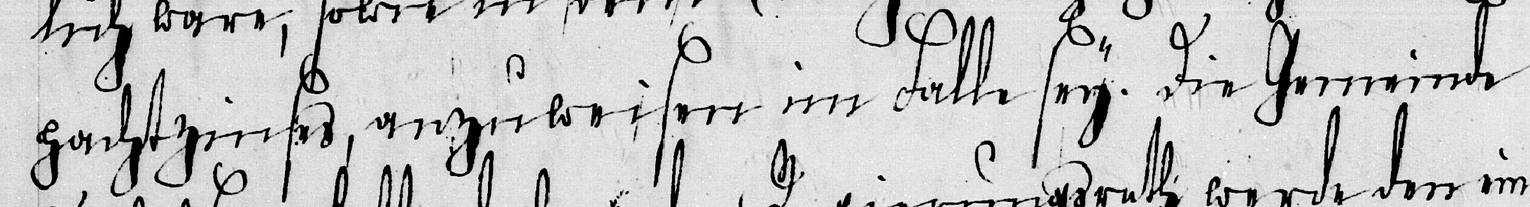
pachtzinses, anzuweisen im Falle sey. Die Gemeinde
